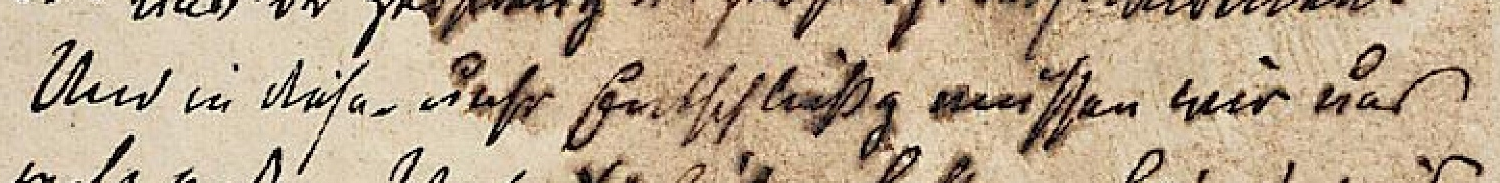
Und in dieser unsr Entschließg müßen wir uns
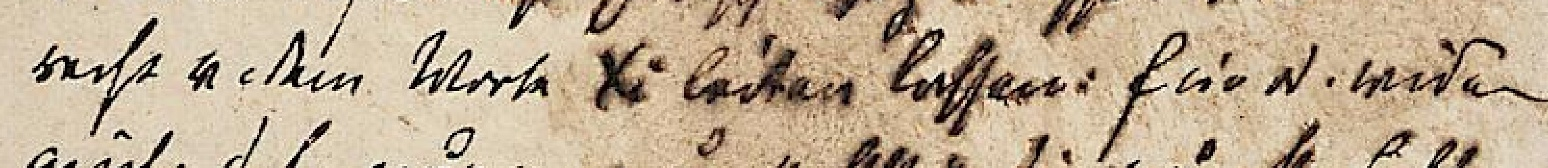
recht v. dem Worte Χι leiten lassen: für od. wider
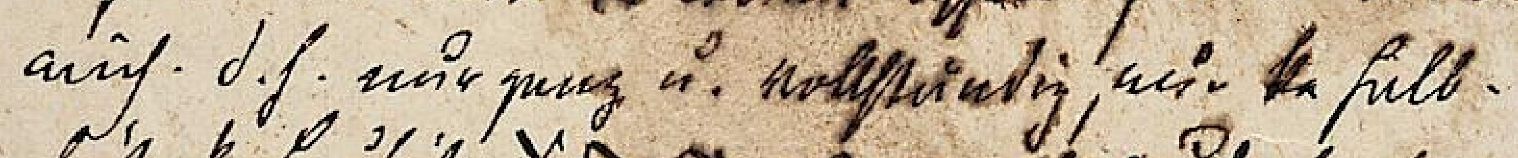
auch d.h. nur ganz u. vollständig, nur kn Halb¬
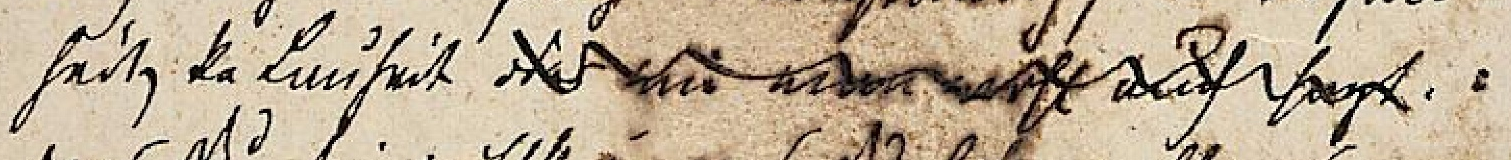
heit, kn Lauheit oder wie men erst auch sagt:
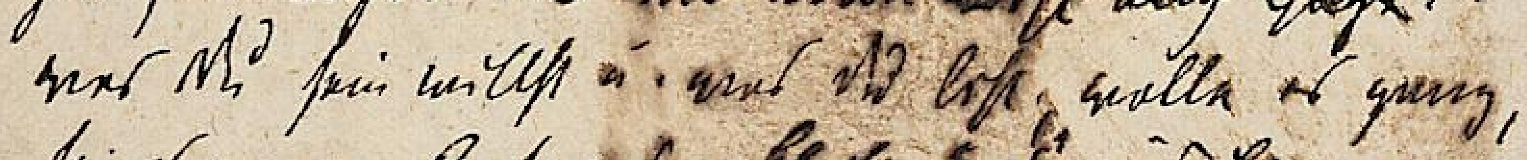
wer Du sein willst u. was du bist, woll es ganz,
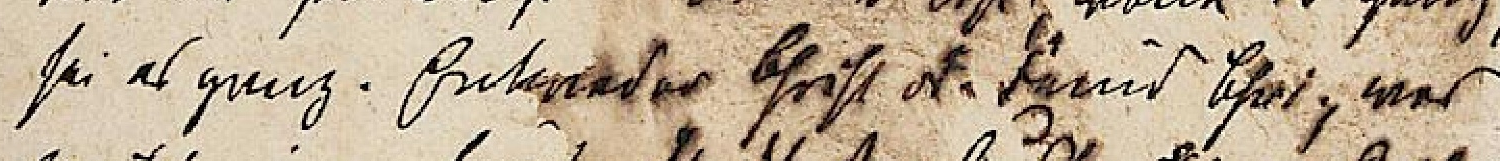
sei es ganz. Entweder Christ od. Feind Chri, was
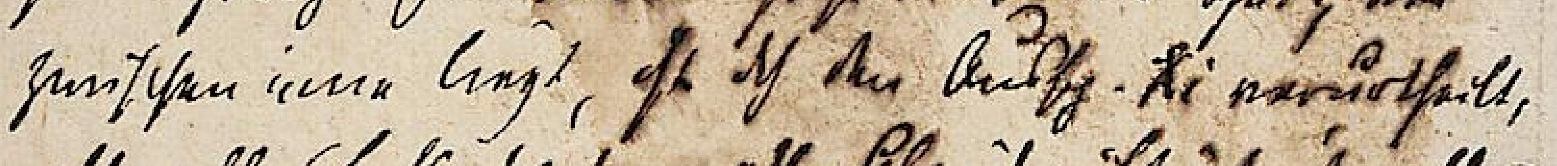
zwischen inne liegt, ist dch den Aussp. Χι verurtheilt,
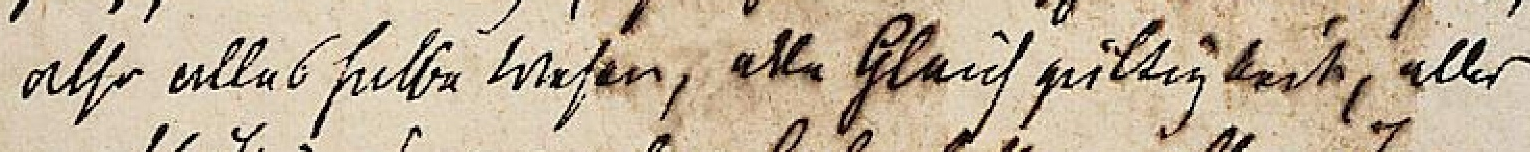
also alles halbe Wesen, alle Gleichgültigkeit, alles
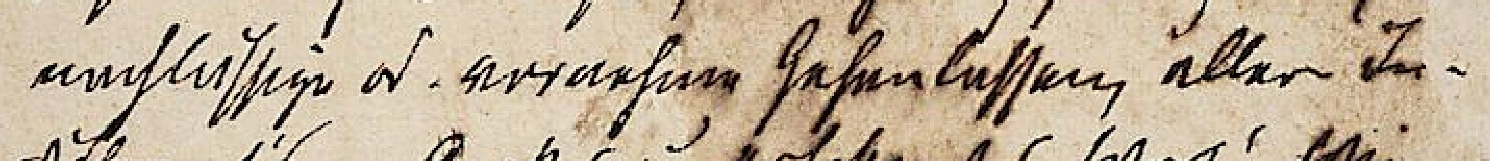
nachlässige od. vornehme Gehenlassen, aller In¬
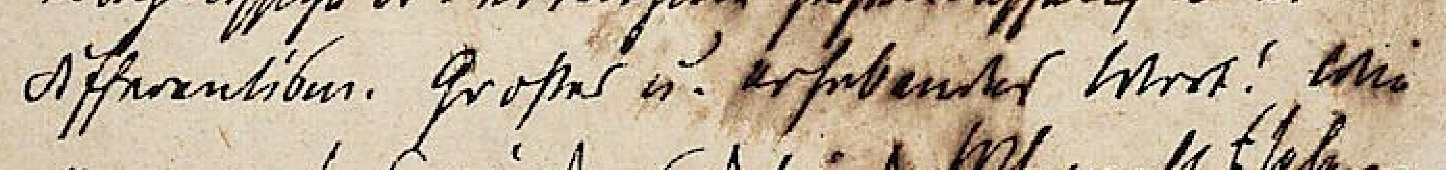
differentism. Grußes u erhebendes Wort! Wie
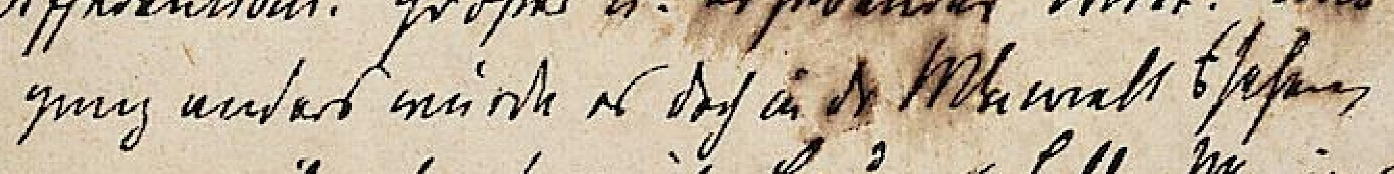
ganz anders würde es doch in der Mnwelt ssehen,
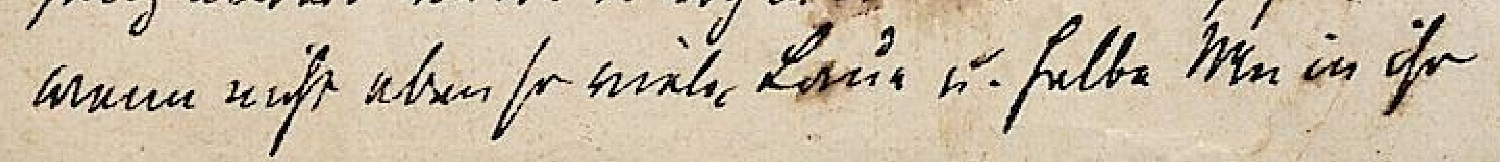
wenn nicht eben so viele Laue u. Halbe Mn in ihr
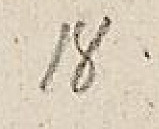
18
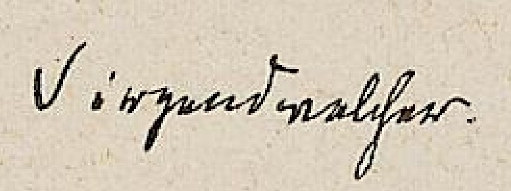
V irgendwelcher.
